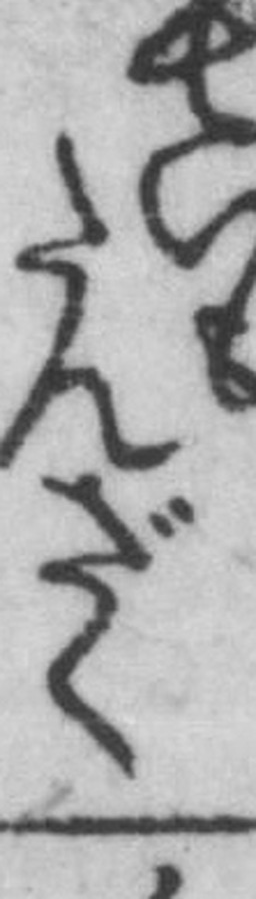たんざく
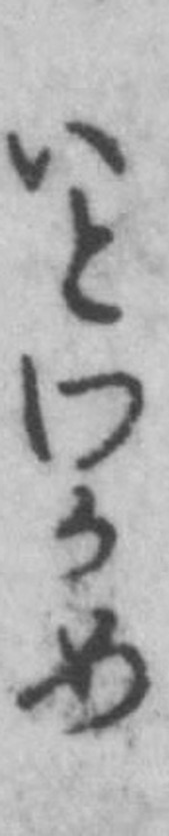いとわかめ
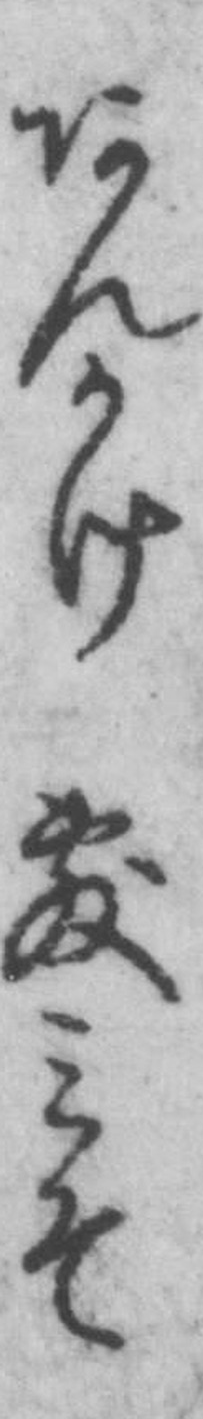あんかけ敷みそ
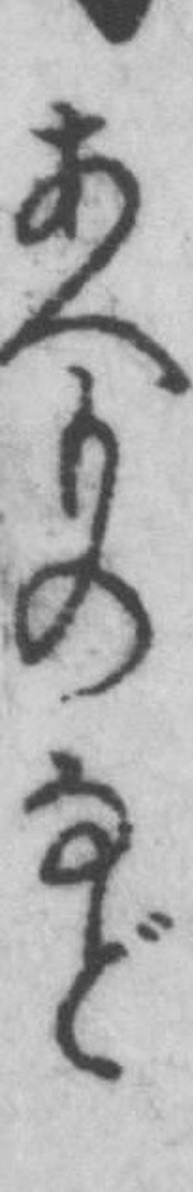あへものなど
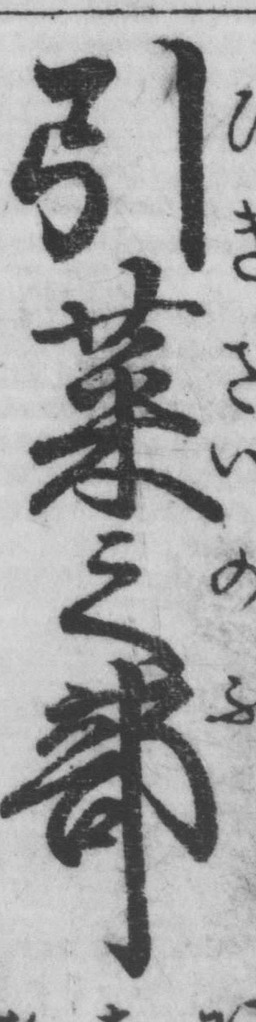引菜之部
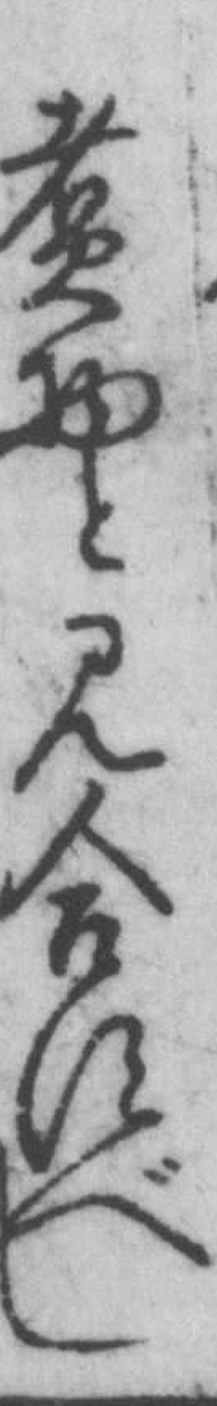煮物と見合すべし
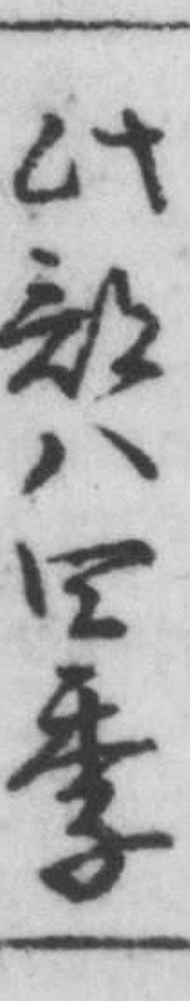此部は四季
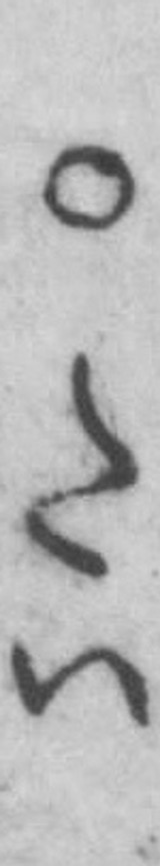○たい
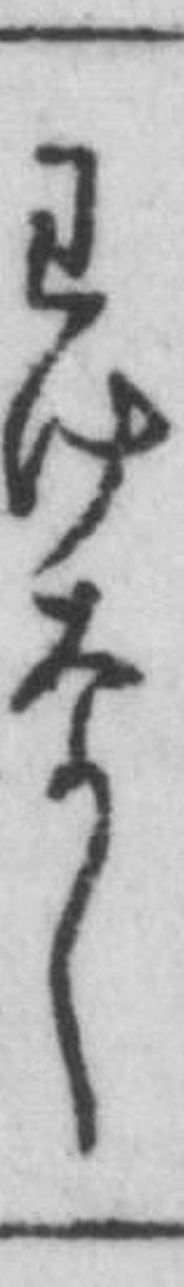わけなく
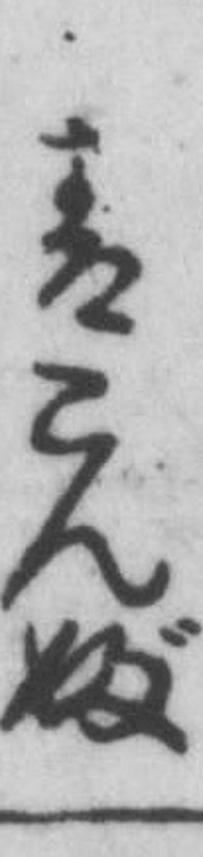青こんぶ
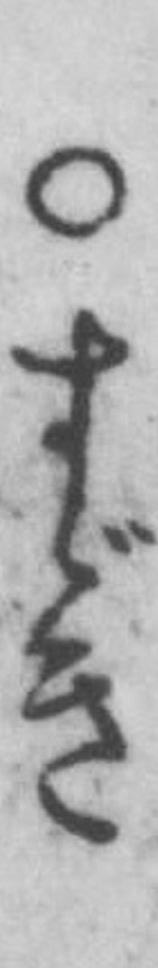○すゞき
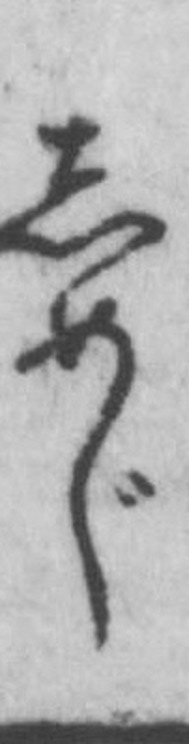しめじ
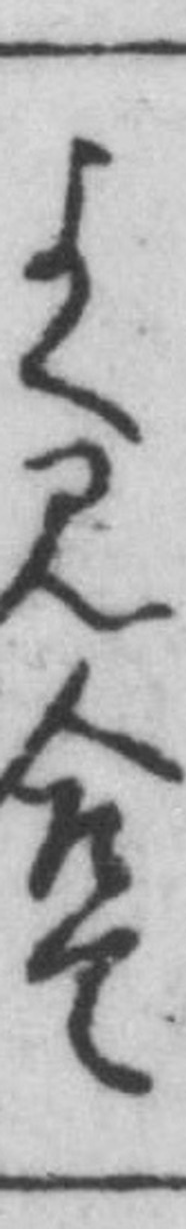よく見合て
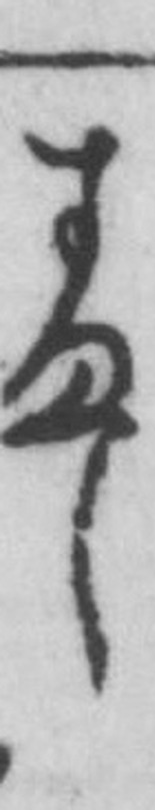すまし
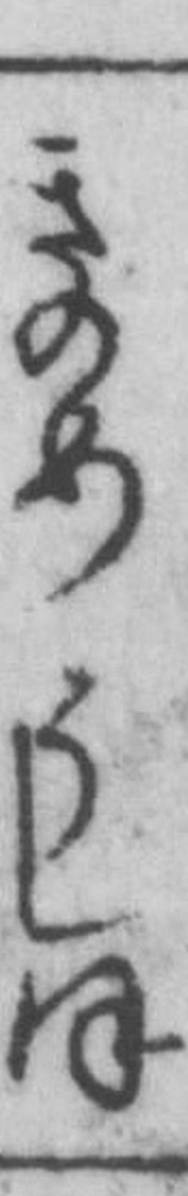きのめうしほ
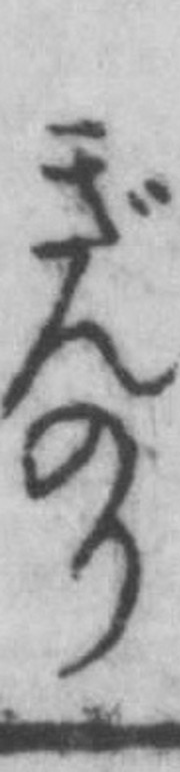ぎんおり
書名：料理献立抄
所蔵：大阪府立大学学術情報センター 国文学研究資料館
